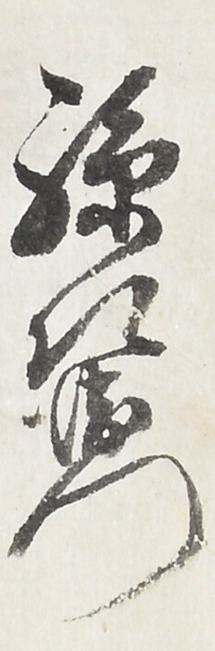孫左衛門
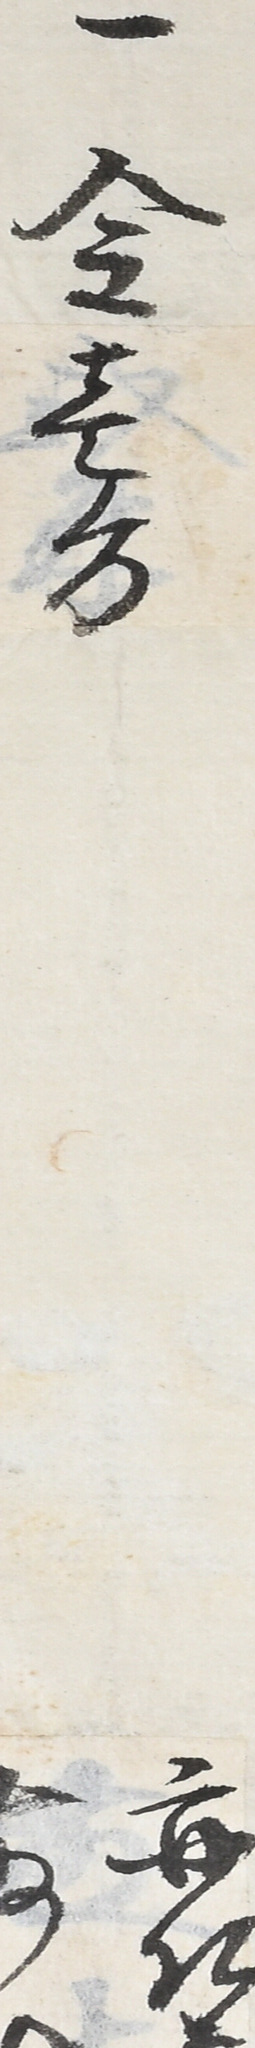一金壱分清太

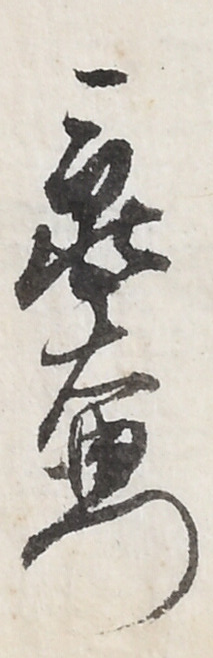伴右衛門
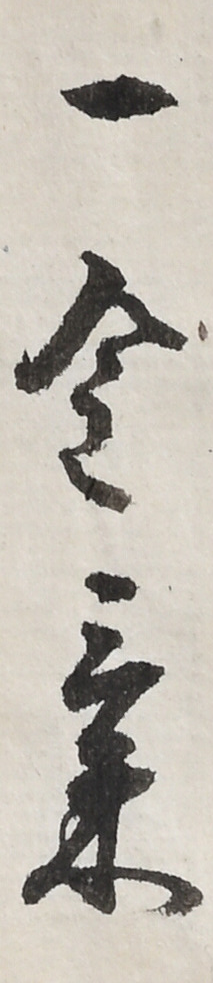一金三朱義八
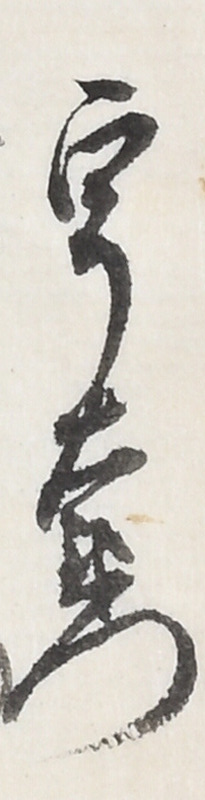伴右衛門
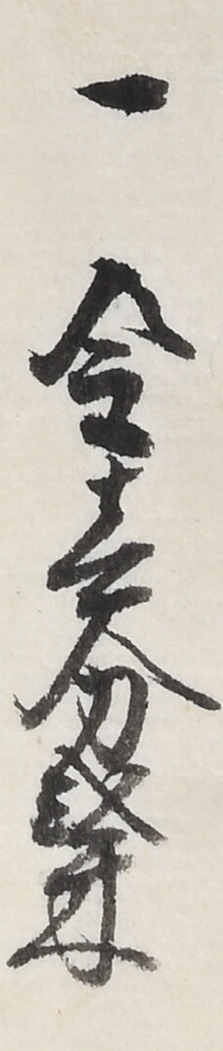一金壱分弐朱善兵衛
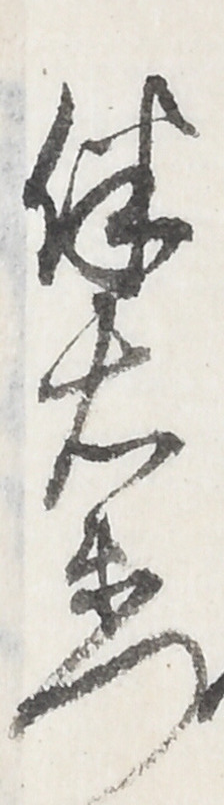伴右衛門
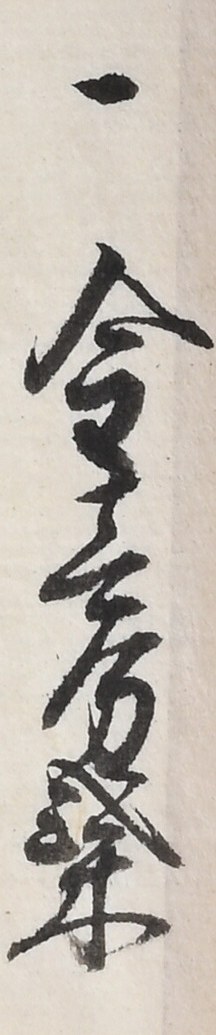一金壱分勘六
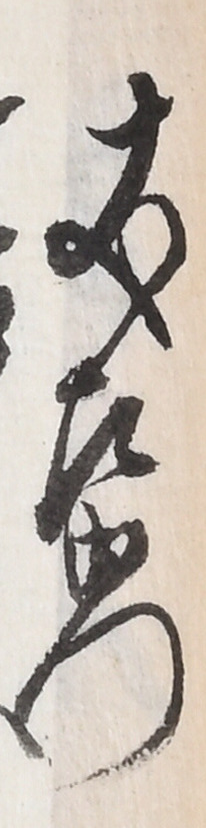丈左衛門
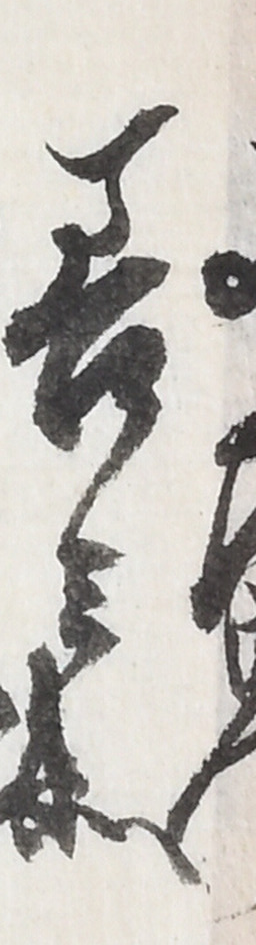作兵衛
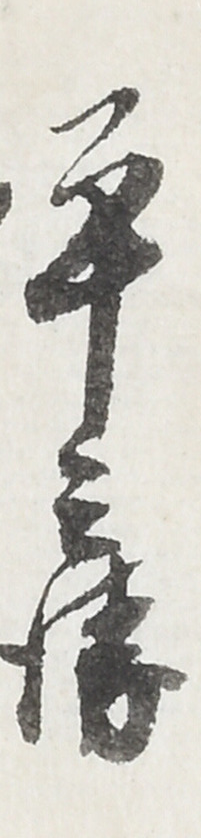作兵衛
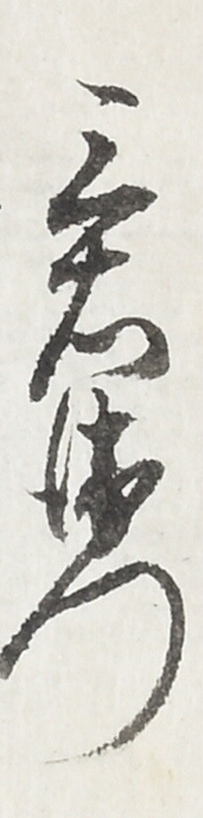三右衛門
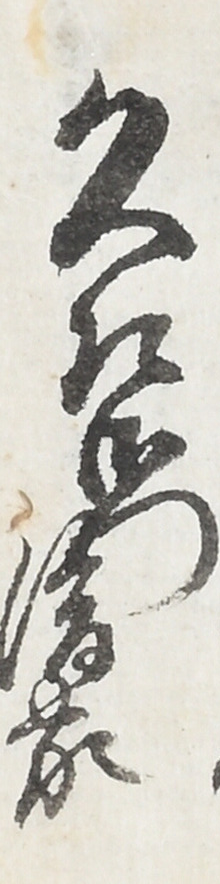久左衛門後家
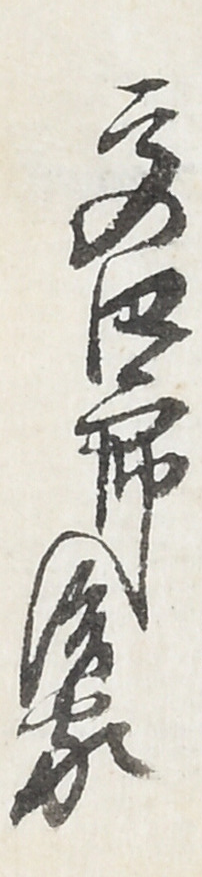多四郎後家

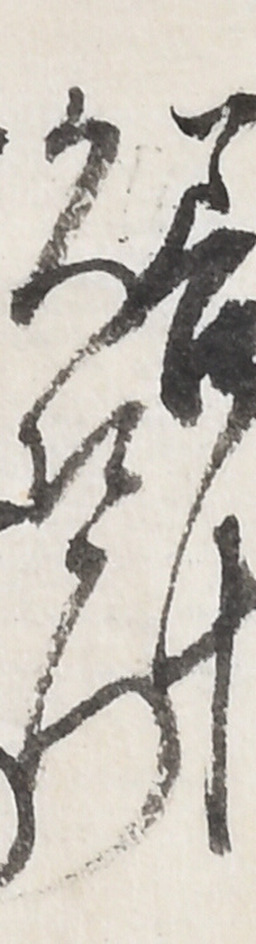久左衛門
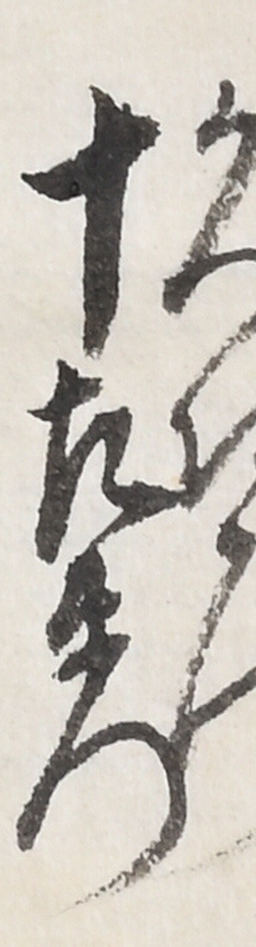十左衛門
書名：御拝地百五拾年御祝儀献上御目録名前
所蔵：伊那市立高遠町図書館・合同会社AMANE
